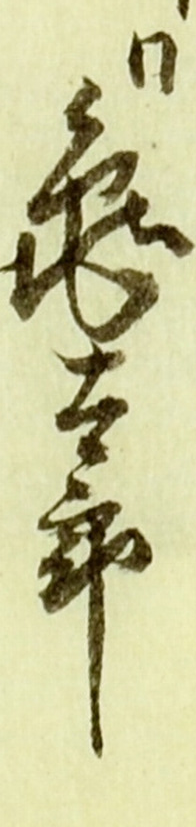亀太郎
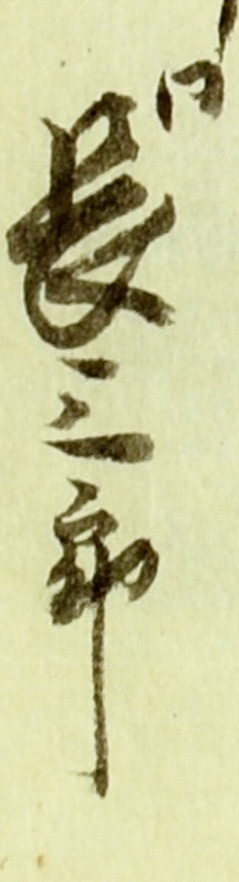長三郎
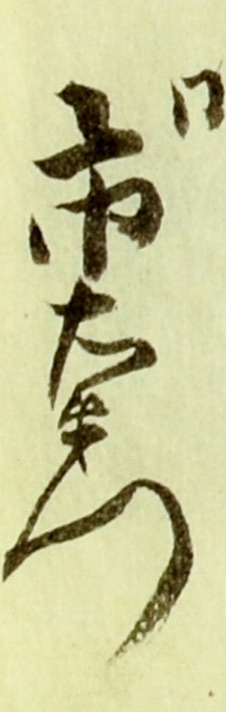市右衛門

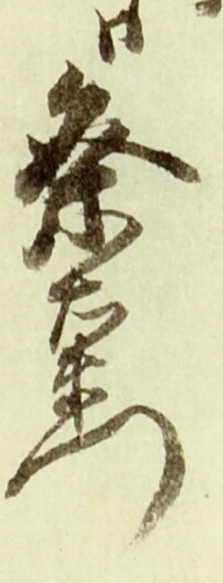粂右衛門
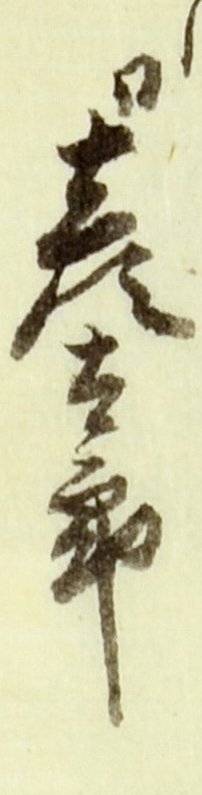彦太郎
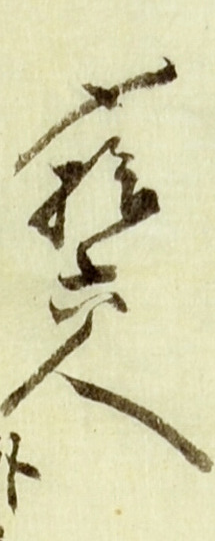〆拾六人
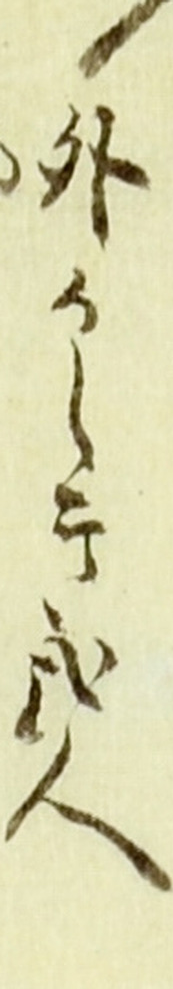外かしき弐人
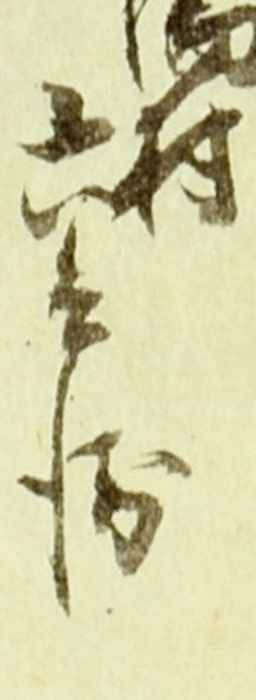六兵衛
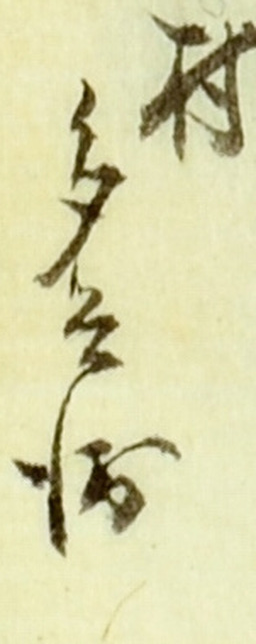多兵衛
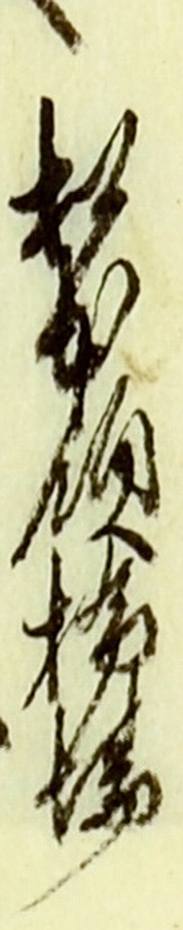松本領橋場
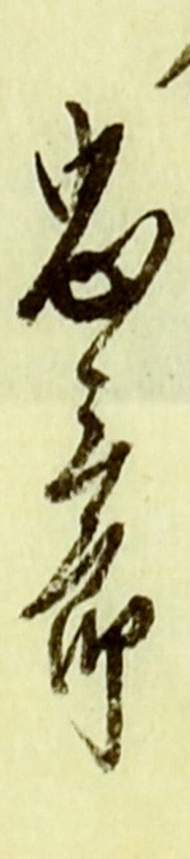忠三郎
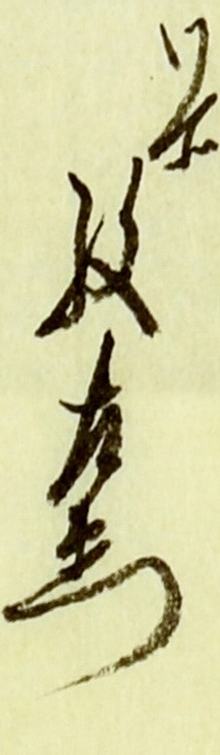紋左衛門
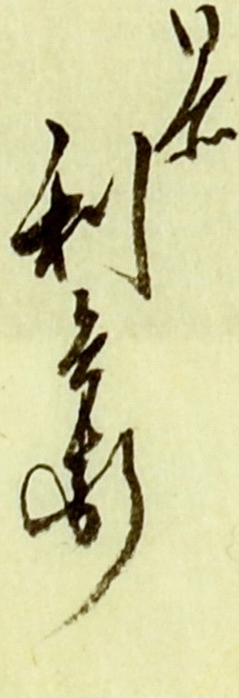利兵衛
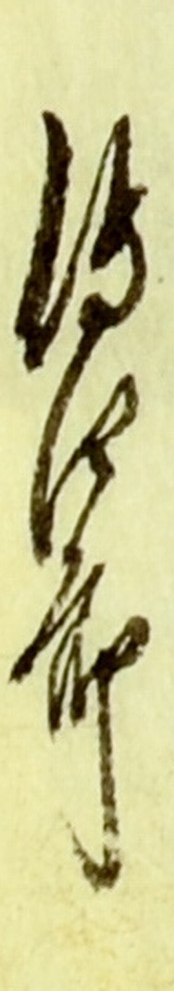伝四郎
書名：小白木條目請書并判取帳
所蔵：伊那市立高遠町図書館・合同会社AMANE
